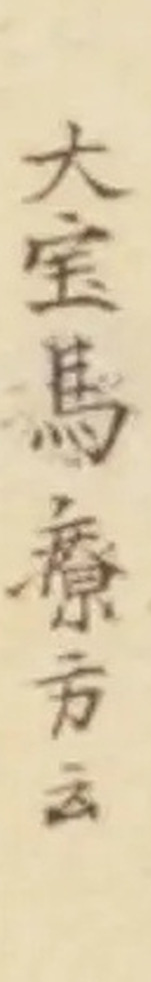大宝馬療方云
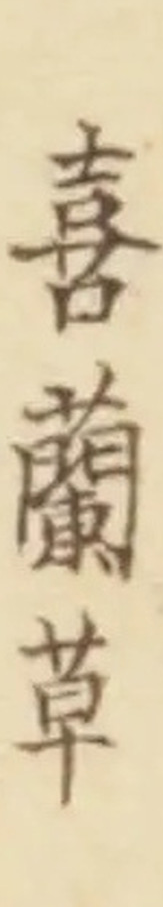喜蘭草
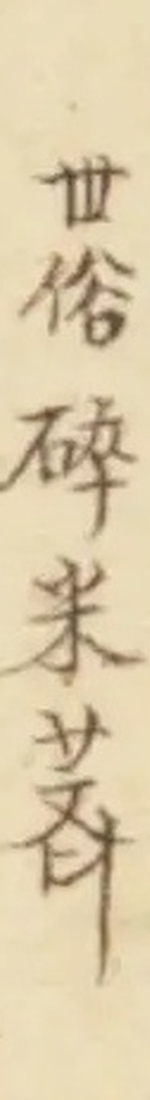世俗砕米薺
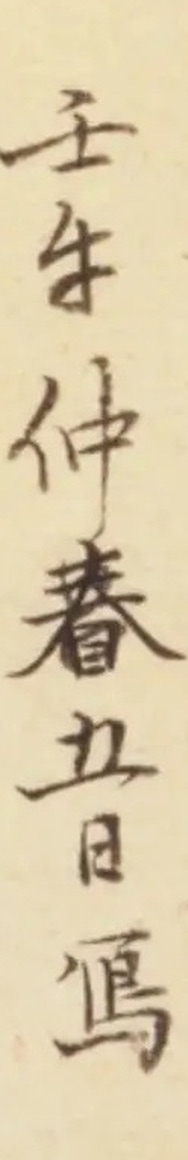壬午仲春五日写
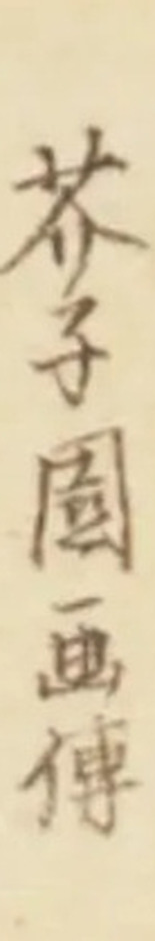芥子園画伝
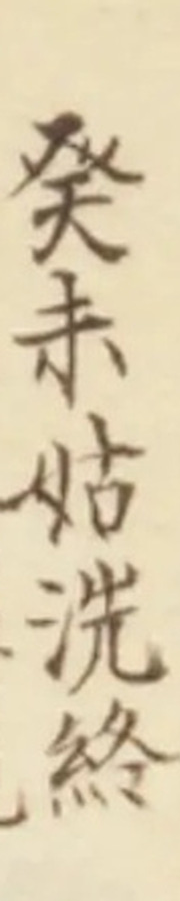癸未姑洗終
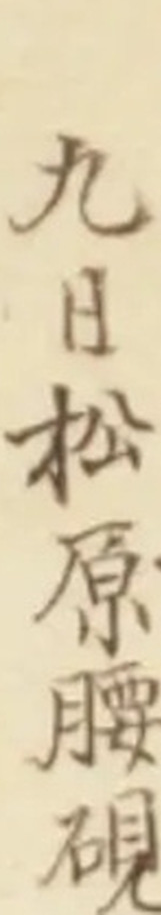九日松原腰硯
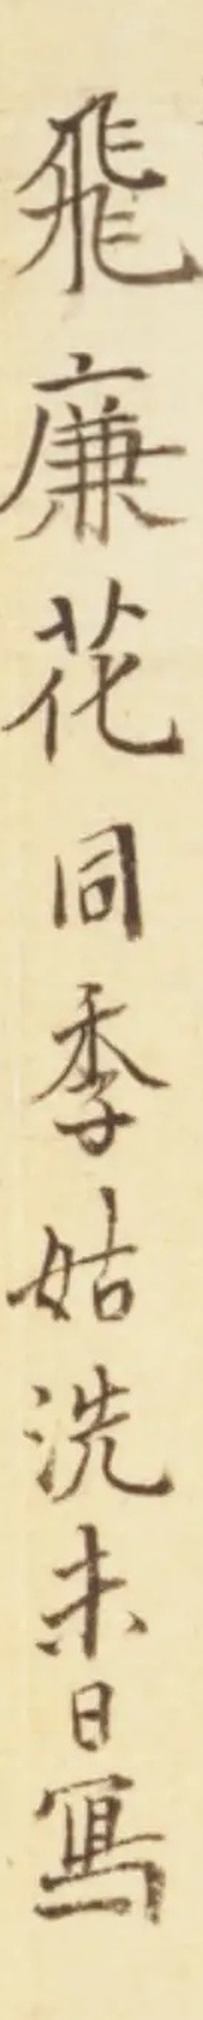飛廉花同季姑洗未日写
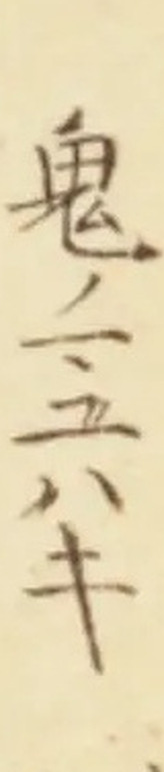鬼ノマユハキ
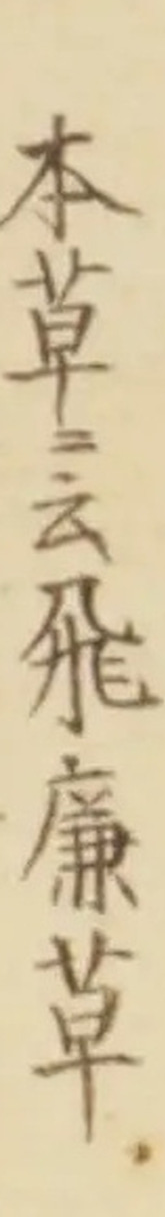本草云飛廉草
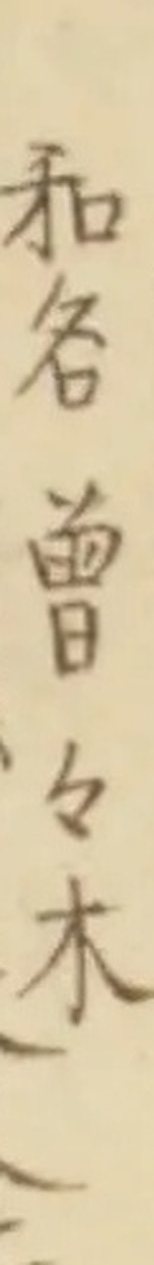和名曽々木
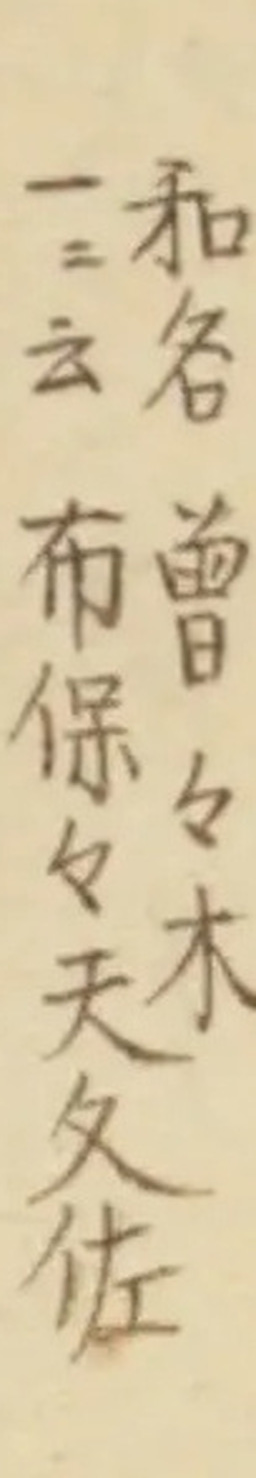一云布保々天久佐
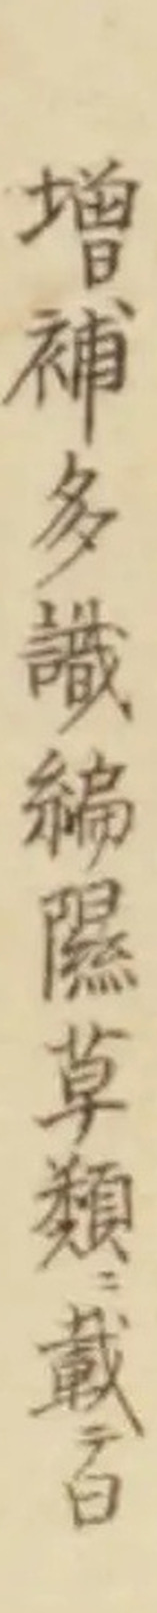増補多識編隰草類載曰

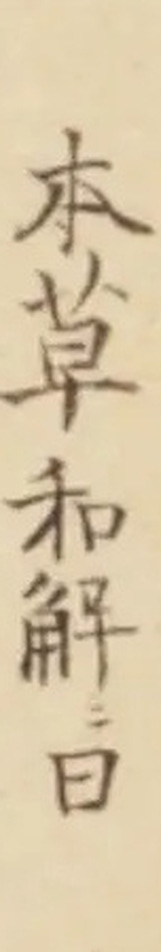本草和解曰
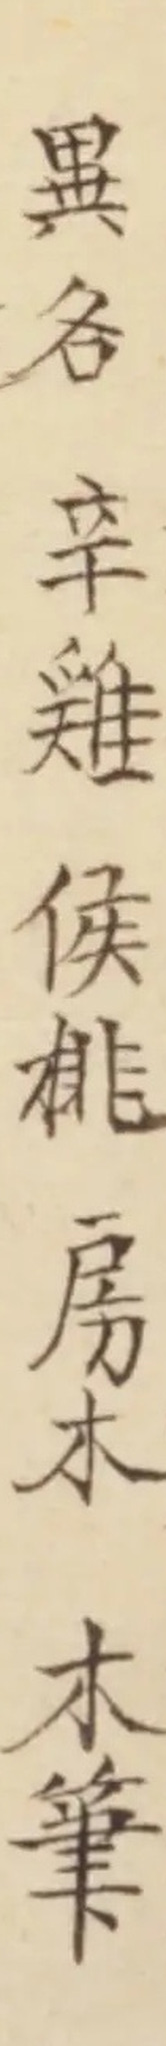異名辛雞侯桃房木木筆
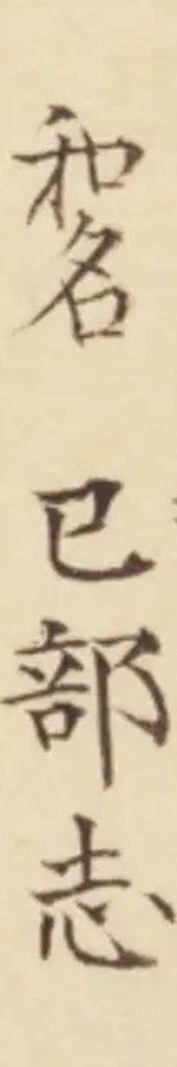和名己部志
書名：梅園草木花譜春之部. 1
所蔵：国立国会図書館 National Diet Library, JAPAN
